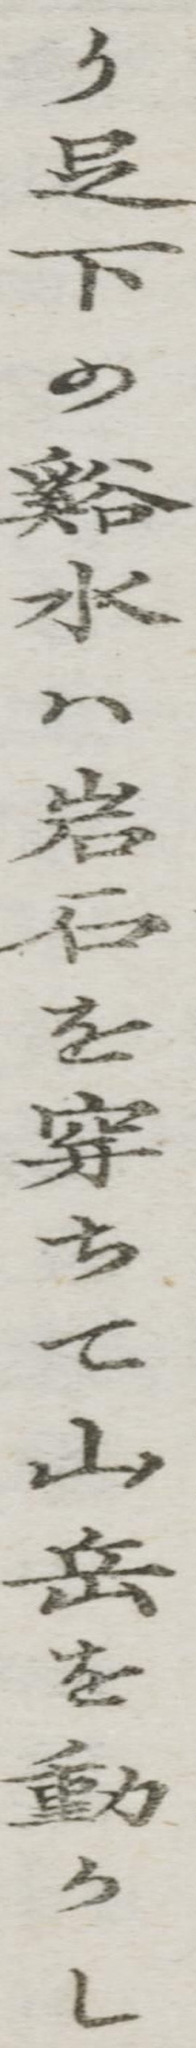り足下の谿水は岩石を穿ちて山岳を動かし
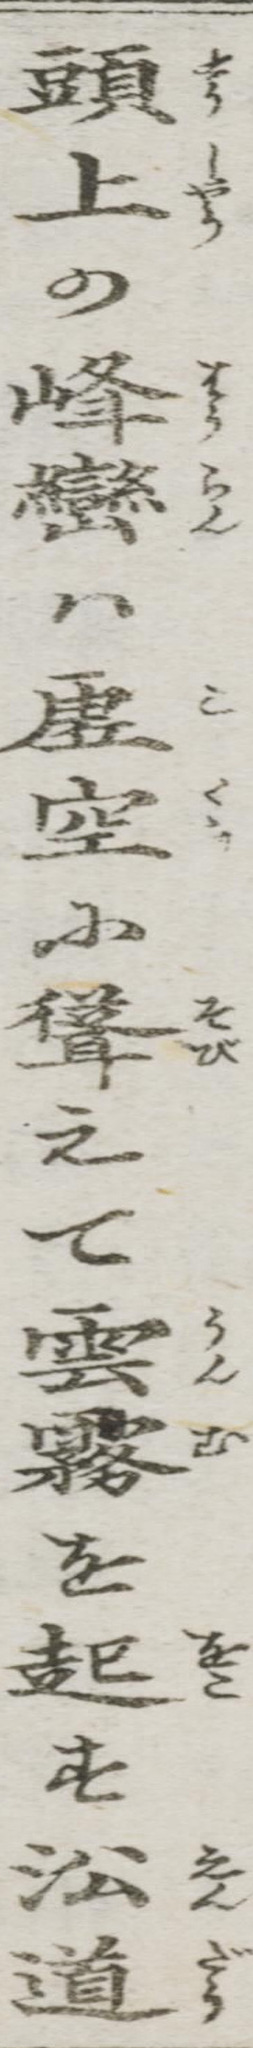頭上の峰巒は虚空に聳えて雲霧を起す沿道
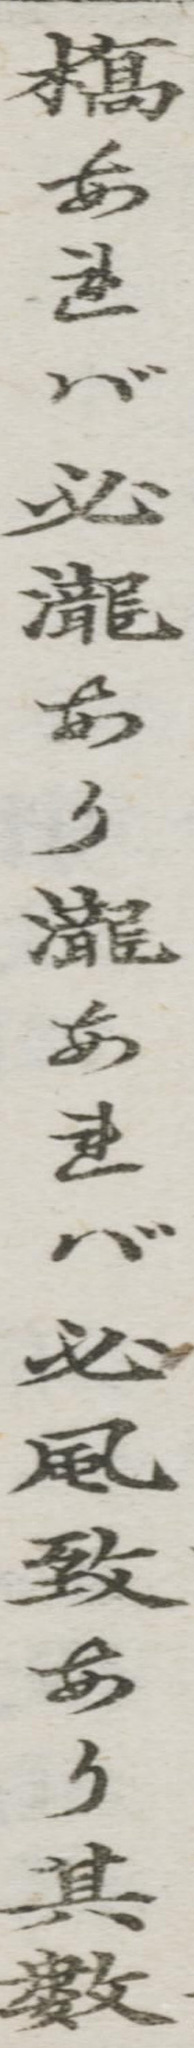橋あれば必滝あり滝あれば必風致あり其数
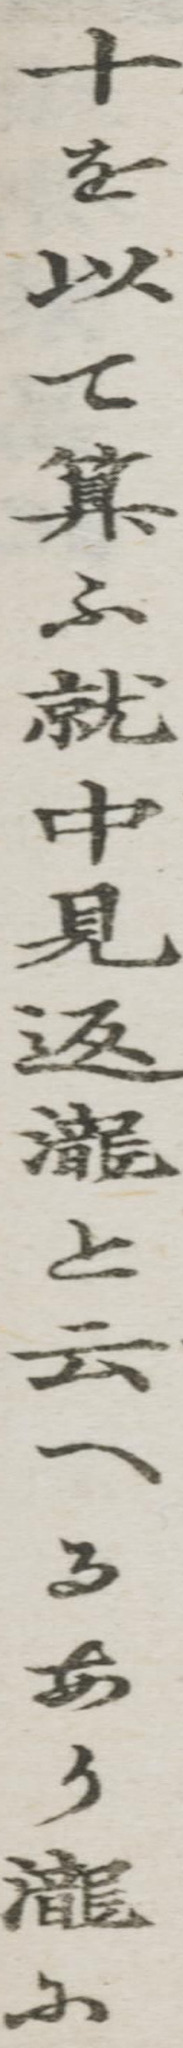十を以て算ふ就中見返滝と云へるあり滝に
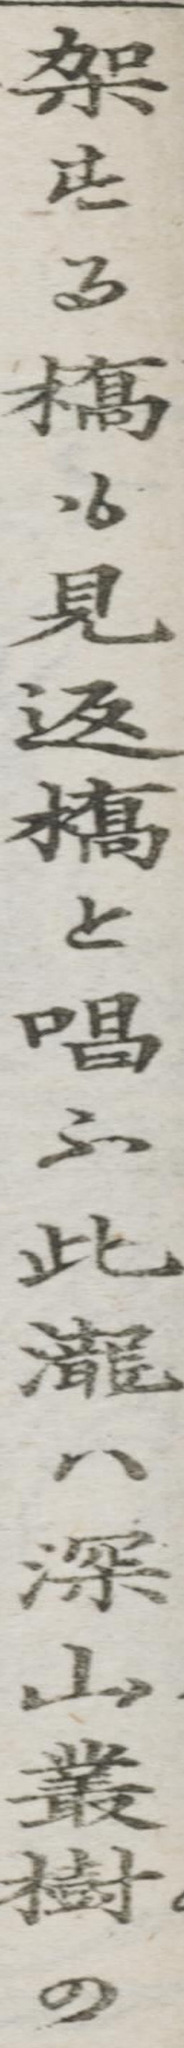架する橋も見返橋と唱ふ此滝は深山叢樹の
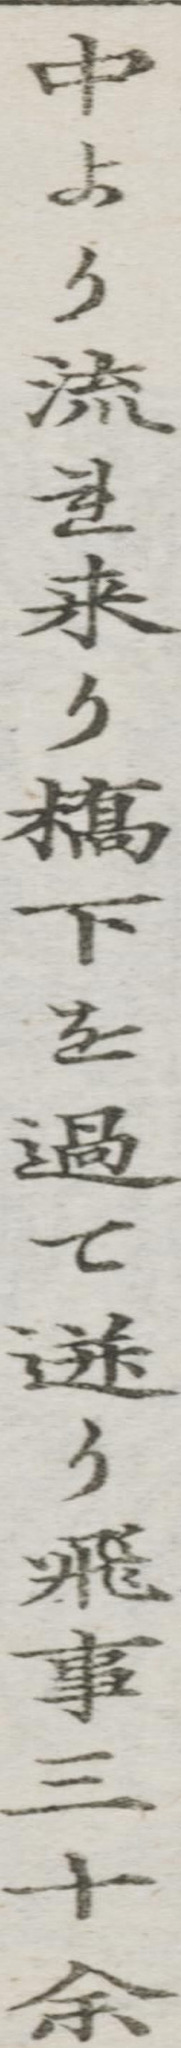中より流れ来り橋下を過て迸り飛事三十余
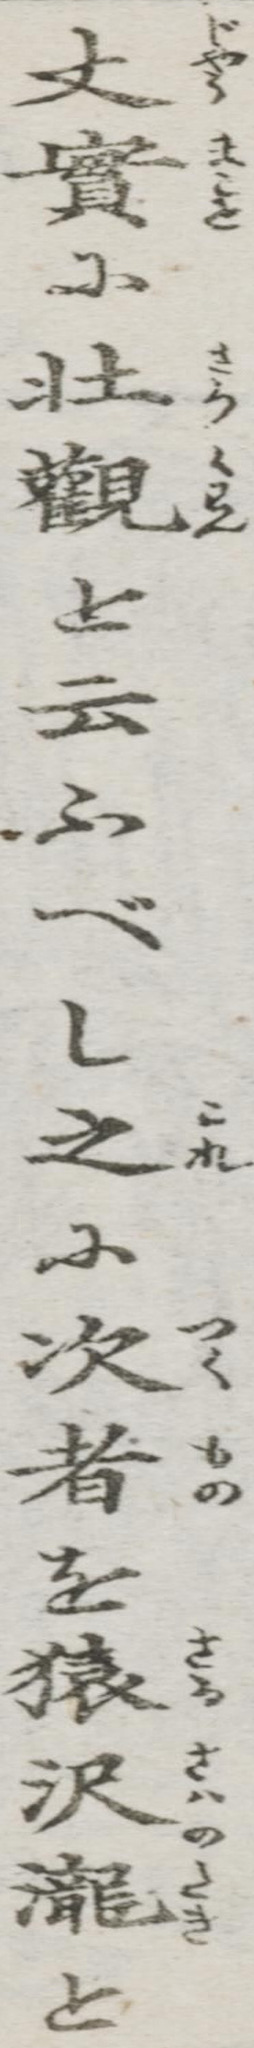丈実に壮観と云ふべし之に次者を猿沢滝と
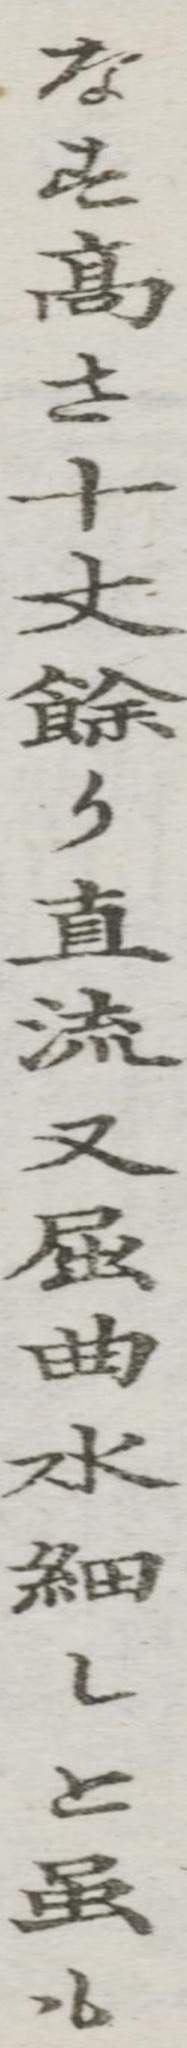なす高さ十丈余り直流又屈曲水細しと雖も
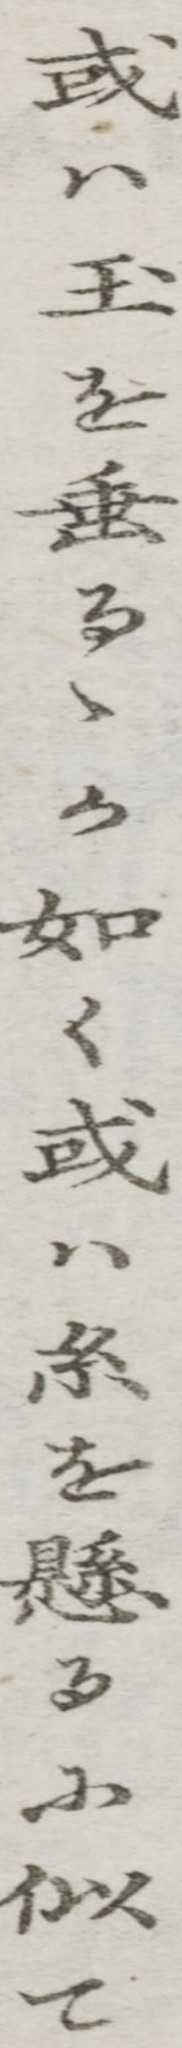或は玉を垂るゝか如く或は糸を懸るに似て
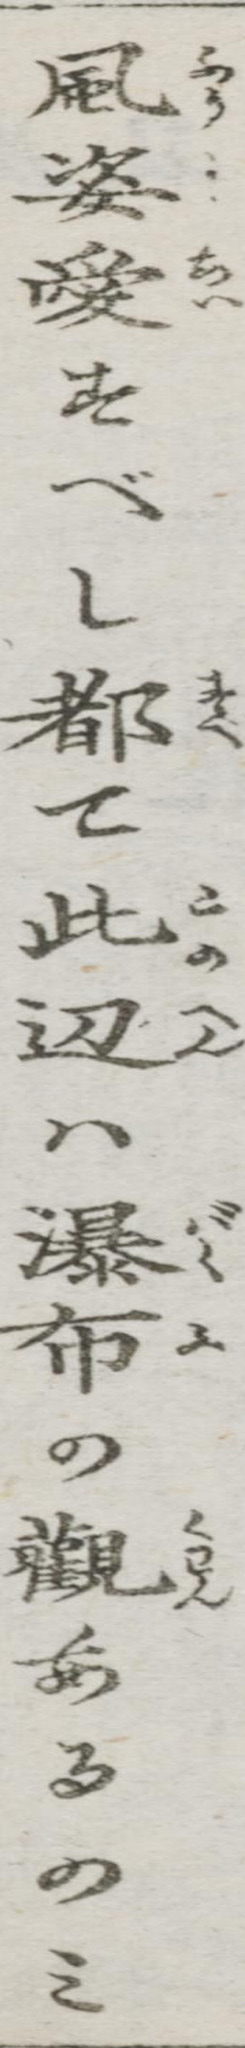風姿愛すべし都て此辺は瀑布の観あるのみ
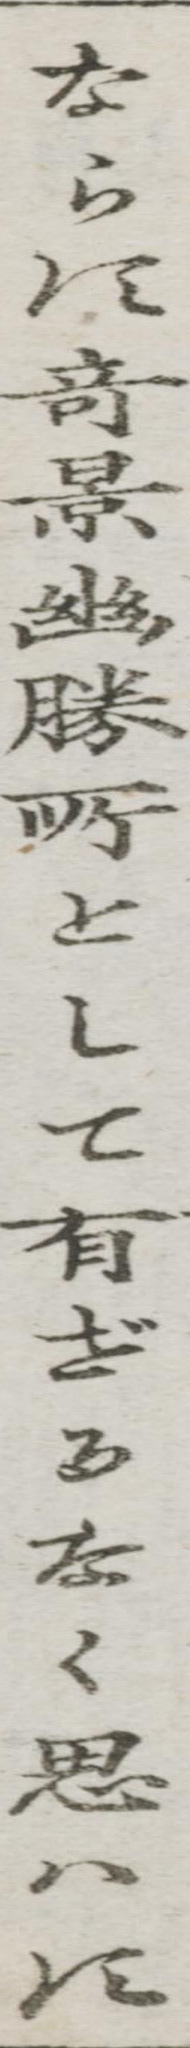ならす奇景幽勝所として有ざるなく思はす
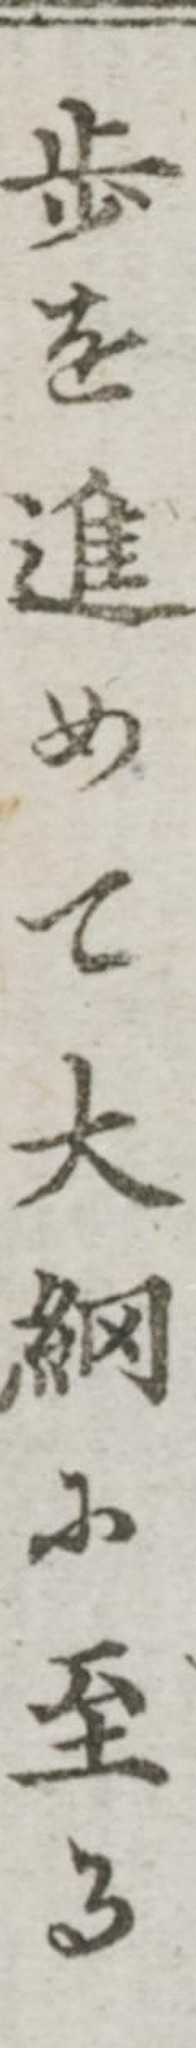歩を進めて大網に至る

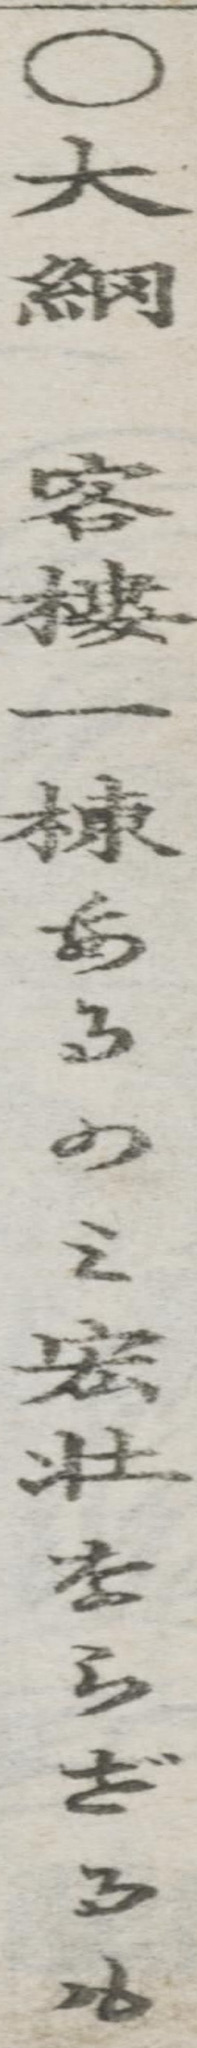○大網客楼一棟あるのみ宏壮ならざるも
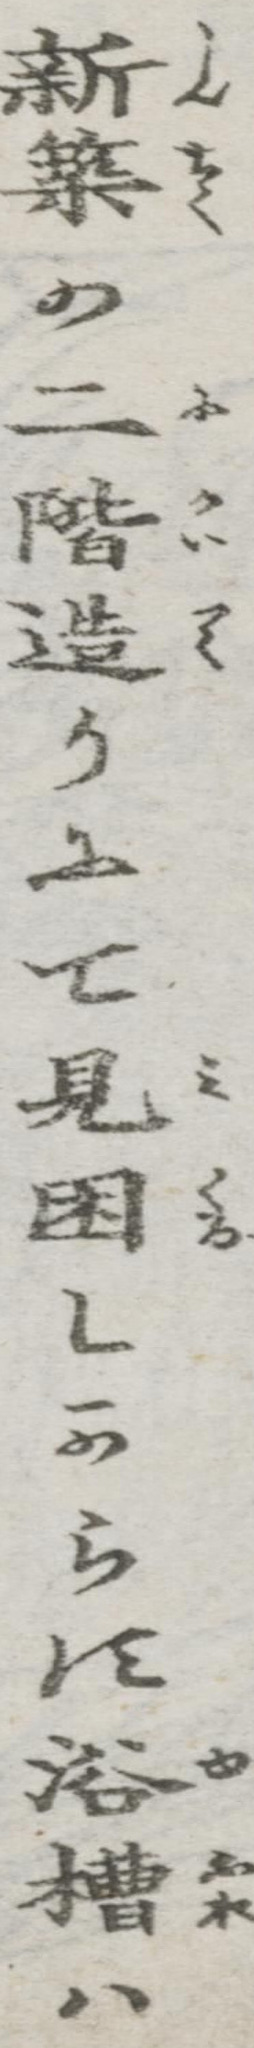新築の二階造りにて見苦しからす浴槽は
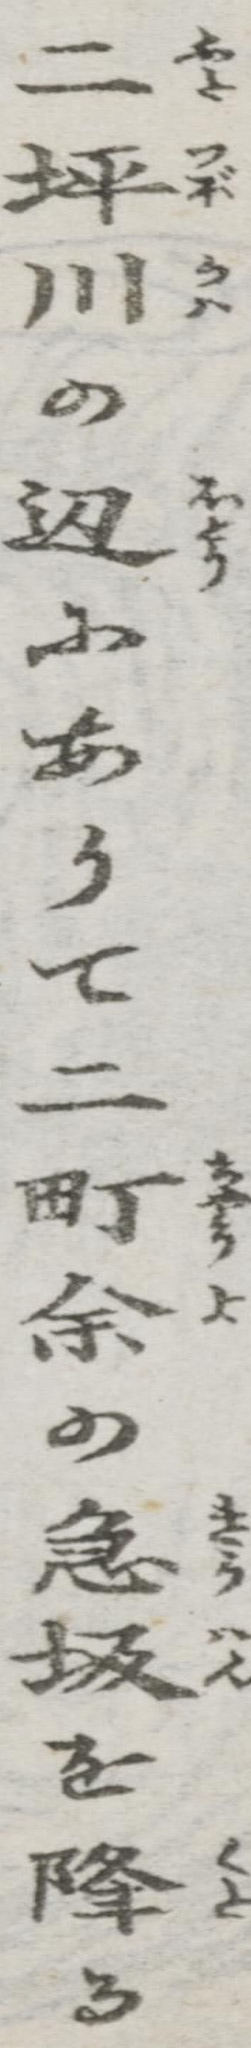二坪川の辺にありて二町余の急坂を降る
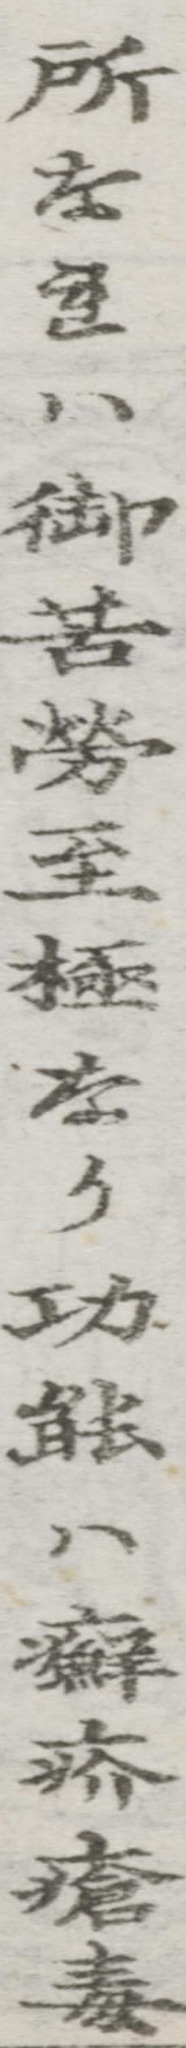所なれは御苦労至極なり功能は癬疥瘡毒
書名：塩原繁昌記　全
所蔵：東京大学地震研究所図書室 Earthquake Research Institute Library, The University of Tokyo, JAPAN
